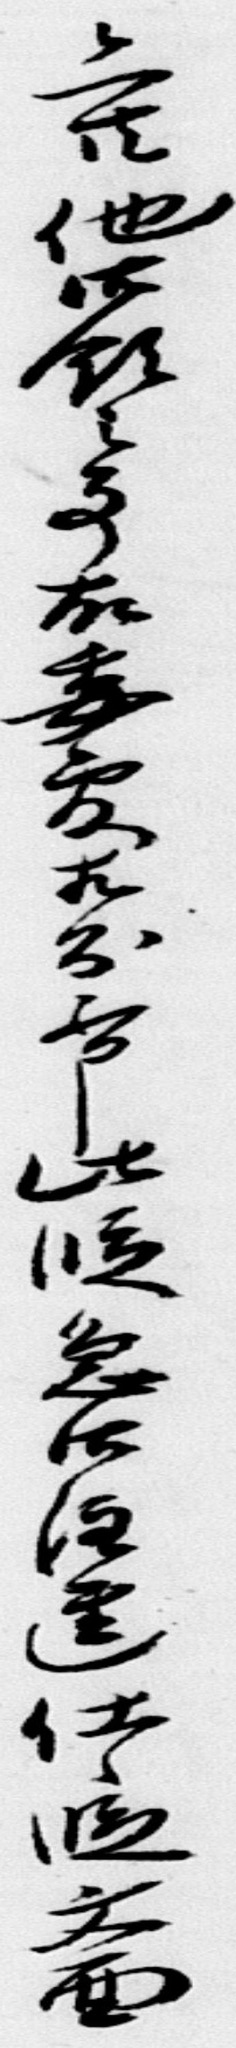候へ共他御領之事故委敷相分不申此段急御注進仕候段文面
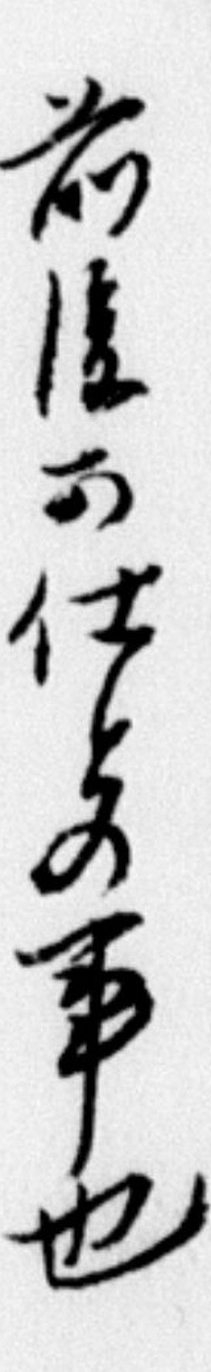前後可仕との事也
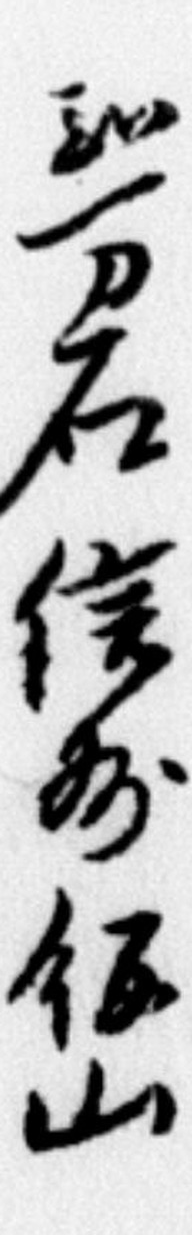弐万石信州飯山
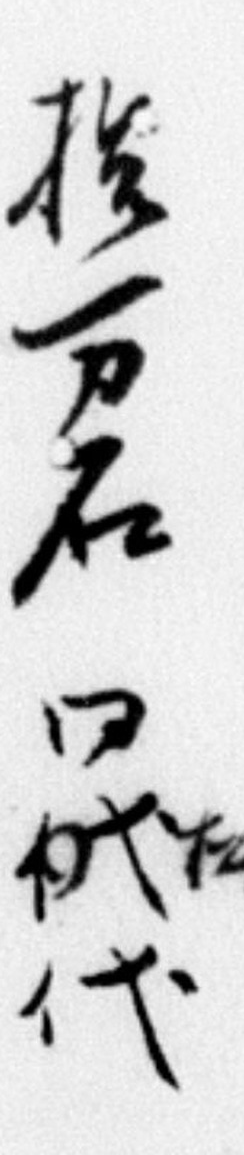拾万石同松代
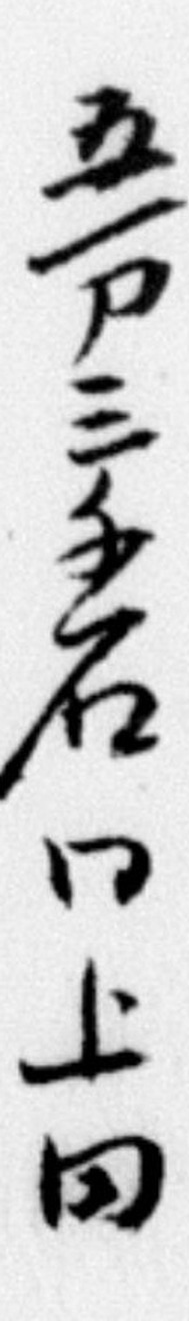五万三千石同上田
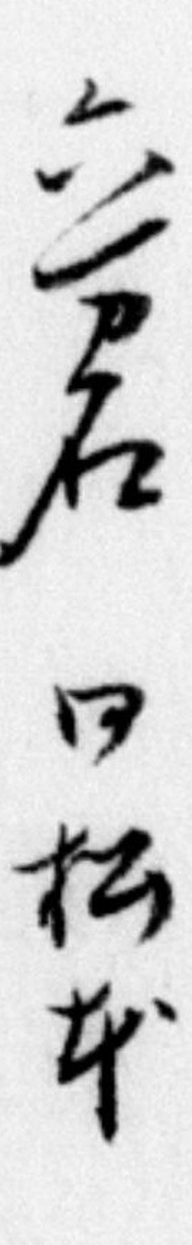六万石同松本
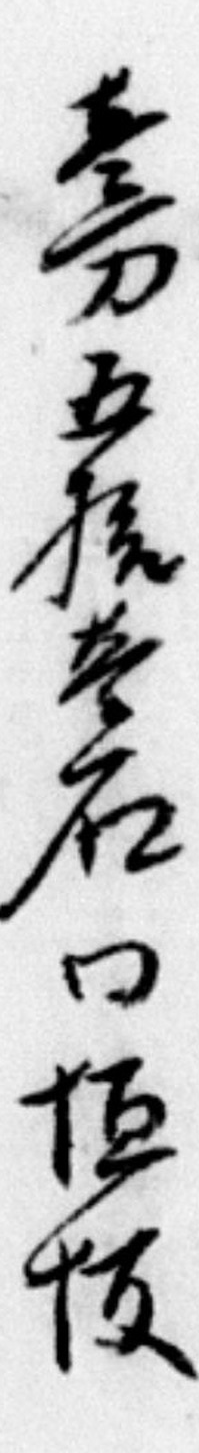壱万五拾壱石同垣坂
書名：信州大地震一件
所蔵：徳島県立図書館
